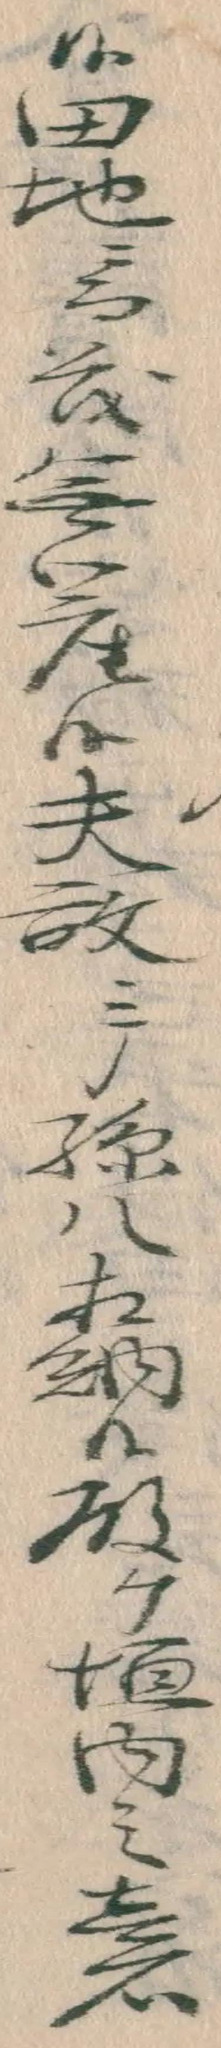候田地ニ而も無御座候夫故ニテ孫八相納候殿ケ垣内之壱石
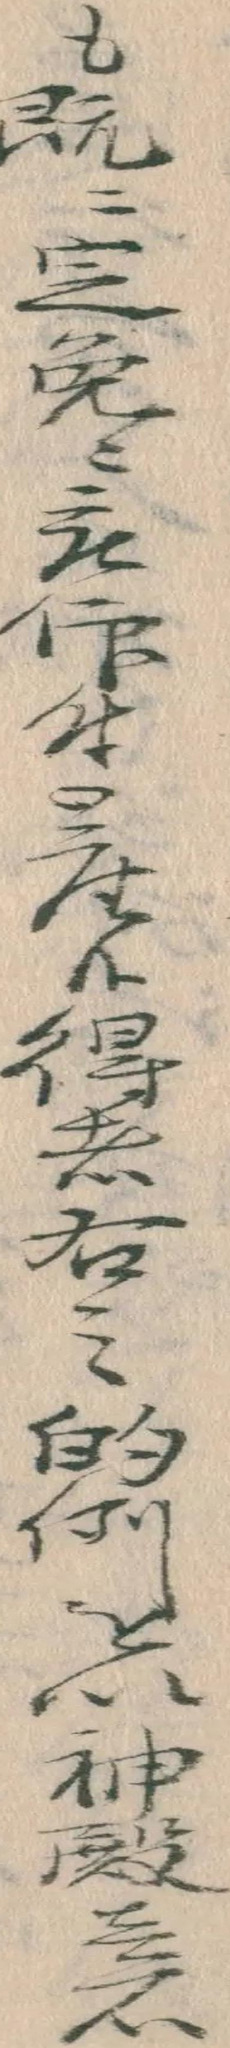も既ニ定免ニ被仰付御座候得者右之的例を以神殿壱石
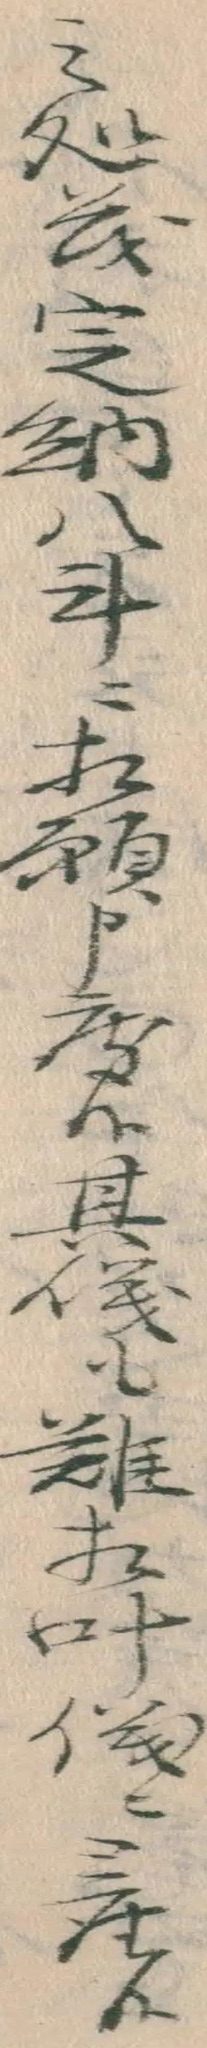之処も定納八斗ニ相願申度候其儀も難相叶儀ニ御座候
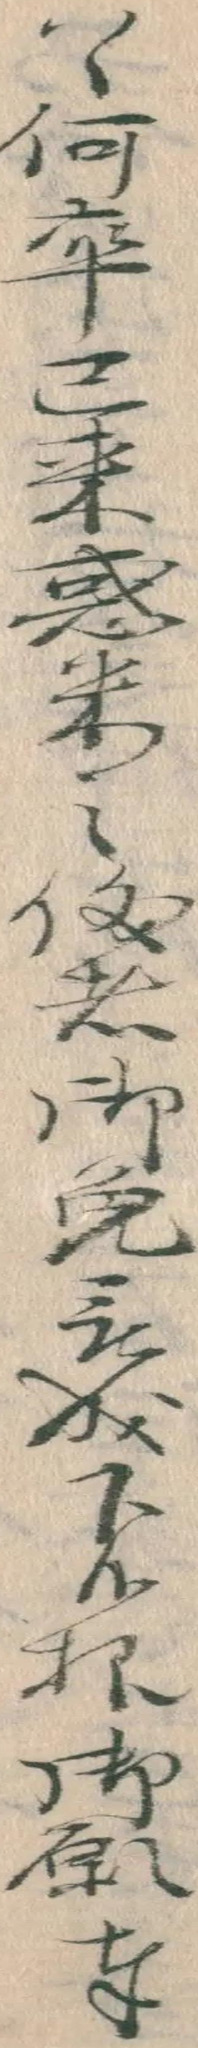ハゝ何卒已来惑米之儀者御免被成下候様御願奉
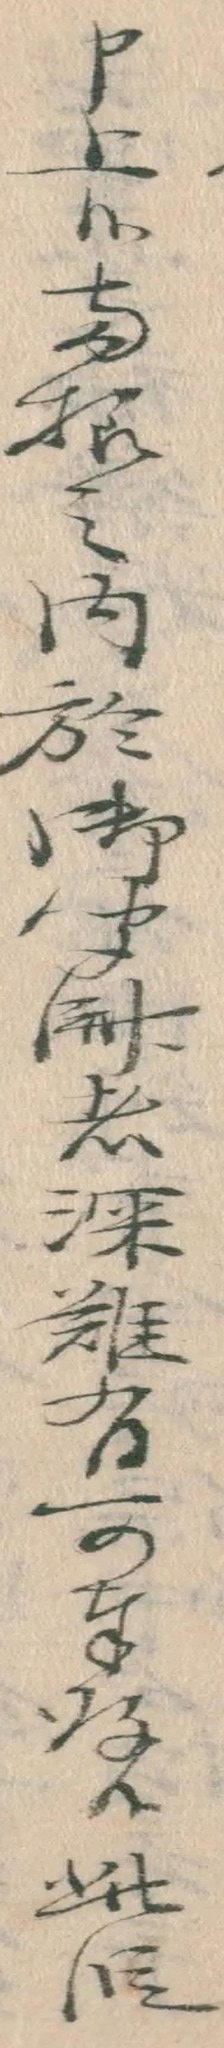申上候両様之内於御聞済者深難有可奉存候此段
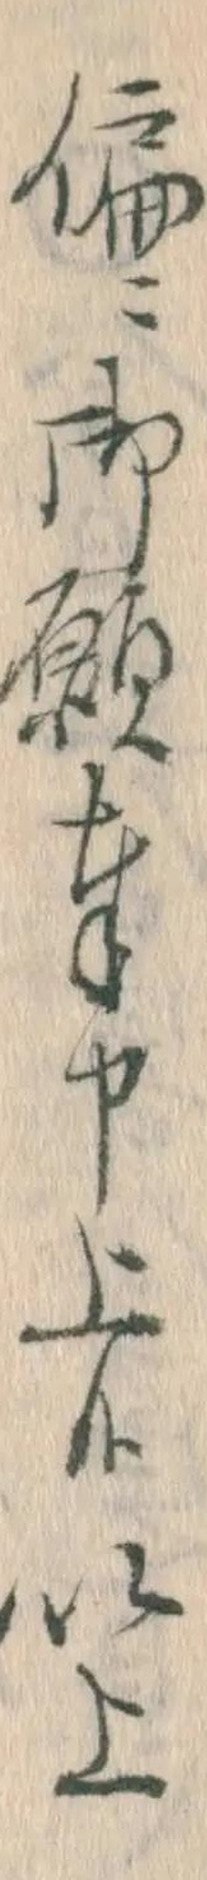偏ニ御願奉申上候以上
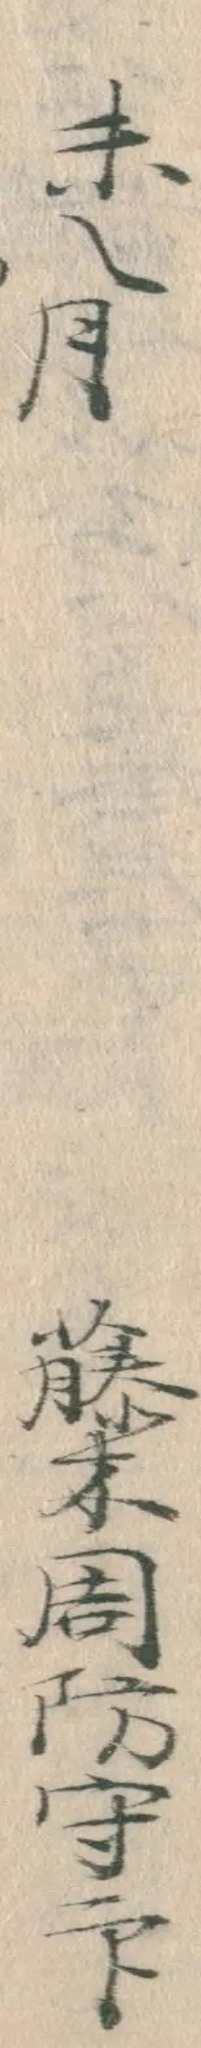未八月藤木周防守印
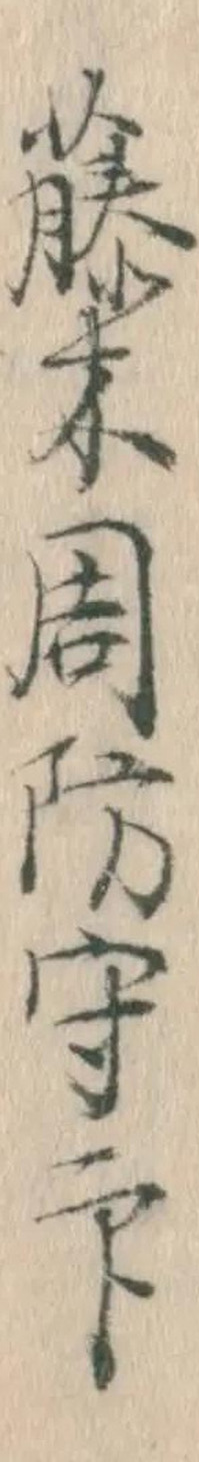未八月藤木周防守印
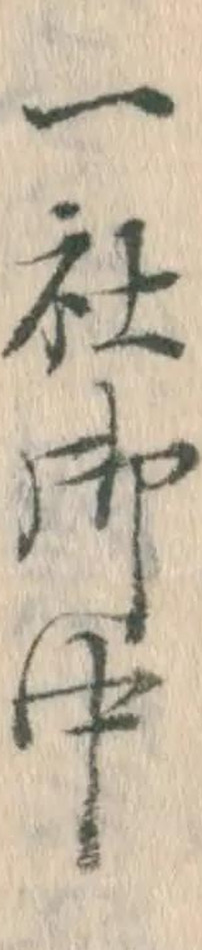一社御中
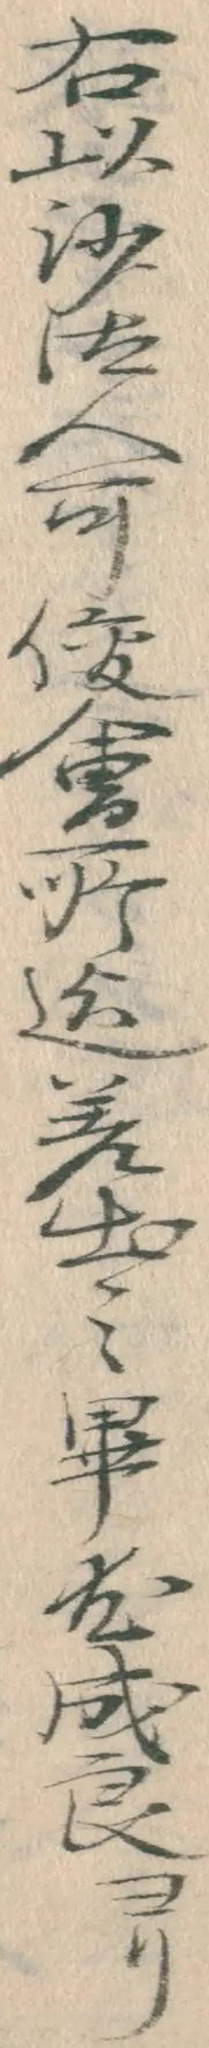右以沙汰人可俊会所迄差出之畢尤成良ヨリ
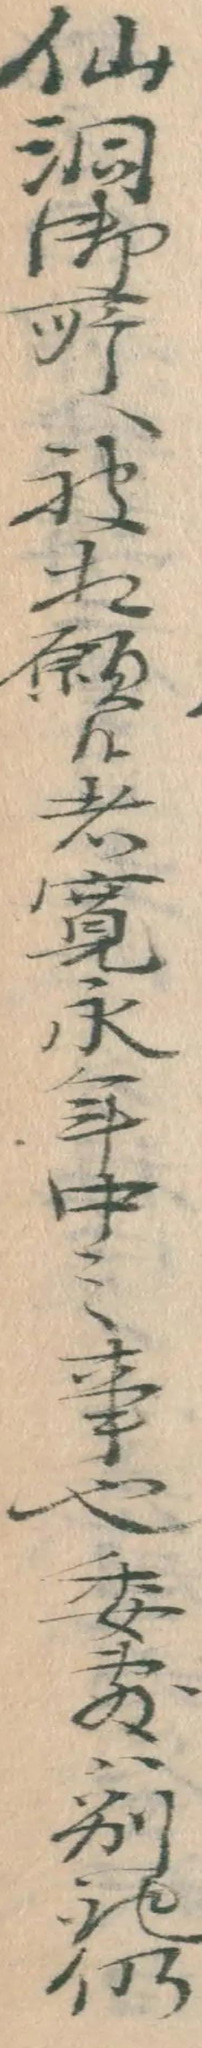仙洞御所へ被相願候者寛永年中之事也委敷ハ別記仍領

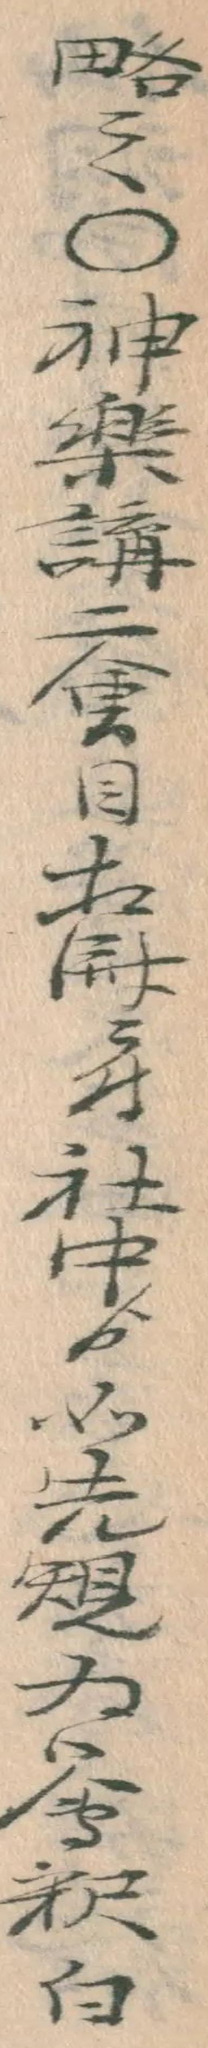略之〇神楽講二會目相済ニ付社中ゟ如先規為御会釈白
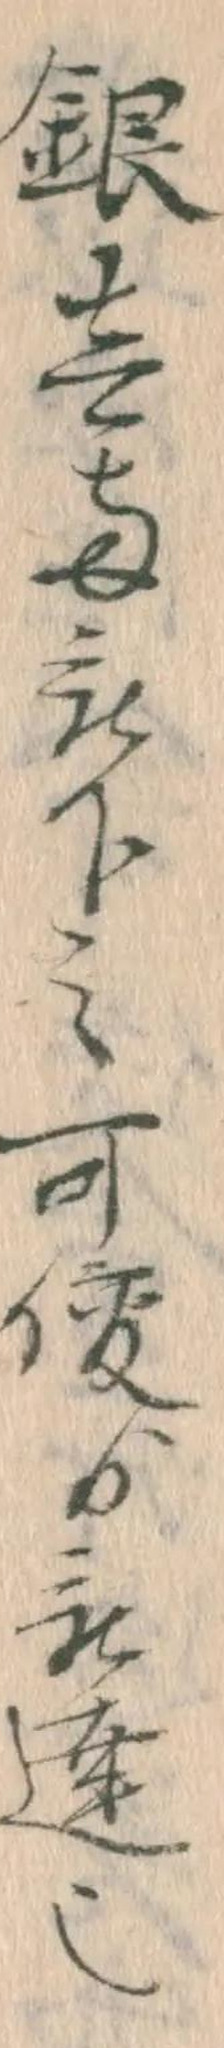銀壱両被下之加俊ゟ被達也
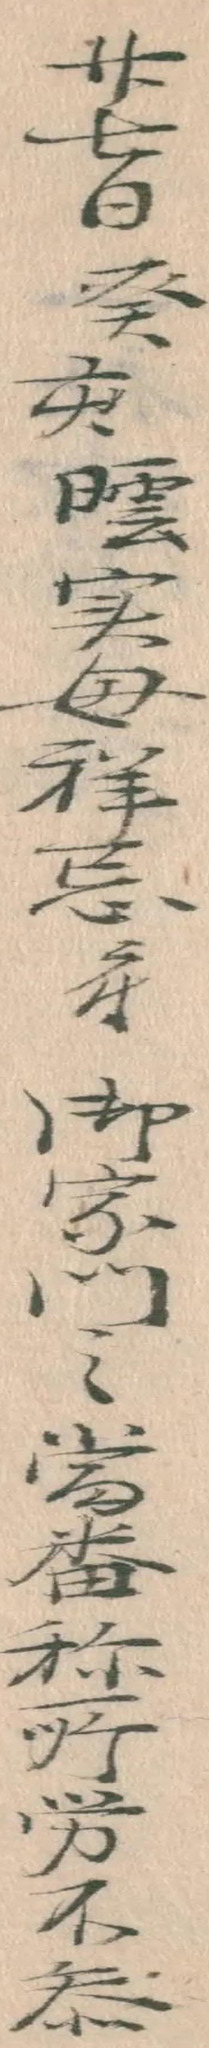廿七日癸亥曇実母祥忌ニ付御家門之当番称所労不参
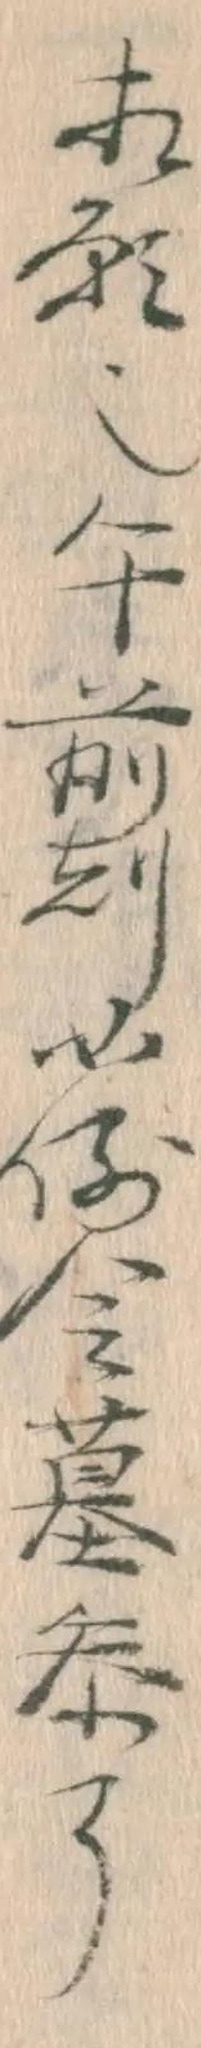相願也午前刻如例令墓参了
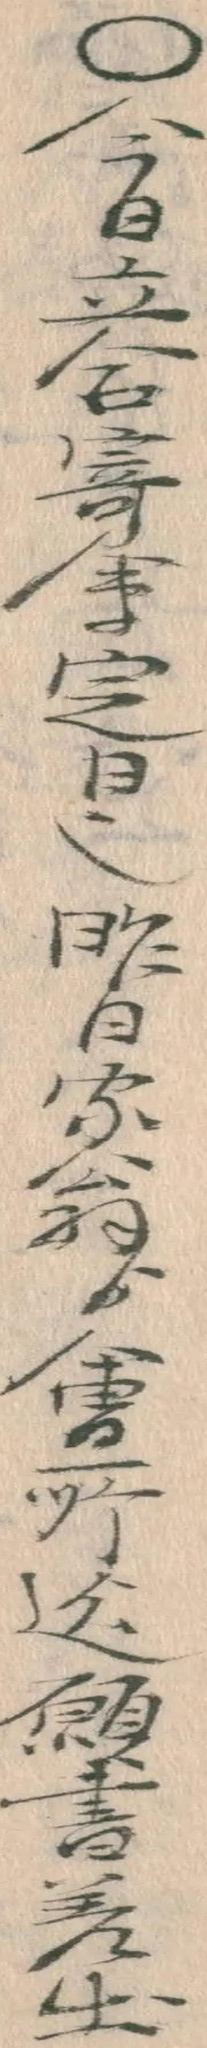〇今日立会寄合定日也昨日家翁ゟ會所迠願書差出
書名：賀茂社記録. 第64冊
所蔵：国立国会図書館 National Diet Library, JAPAN
